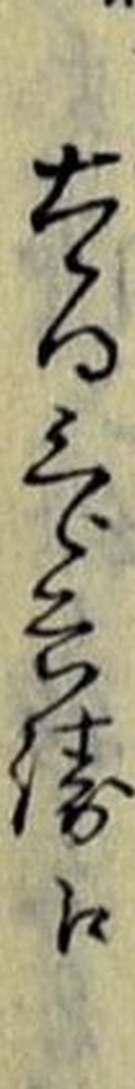太田三郎兵衛江
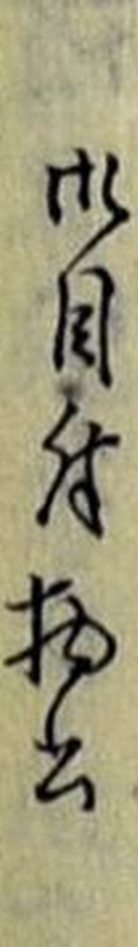御目付物書
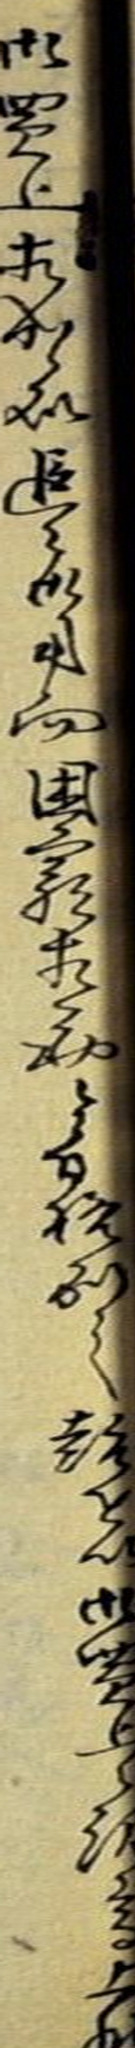御買上相成候処追々御用向困窮相勤候に付各別之趣を以御買上之銀高上納
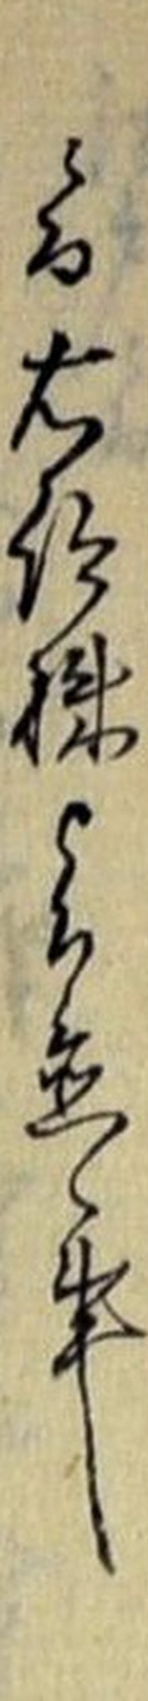に而右跡株被下置候事
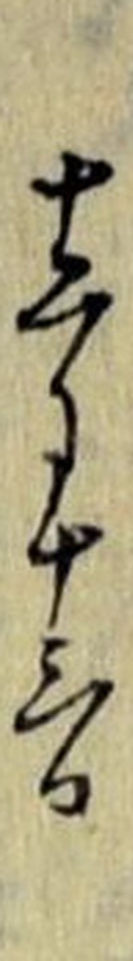十二月十三日

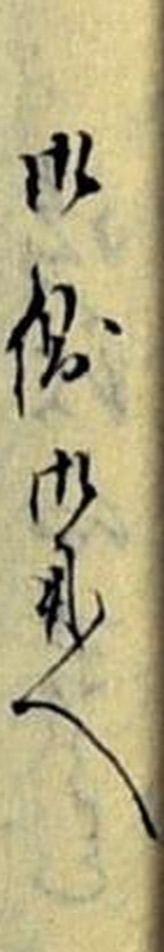御供御用人
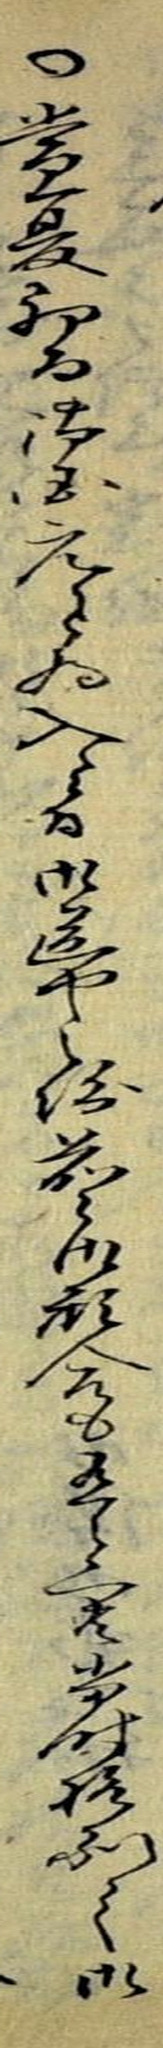○当夏初而御国元被為入候に付御道中之儀前々之御形合も有之候へ共当時格別之御
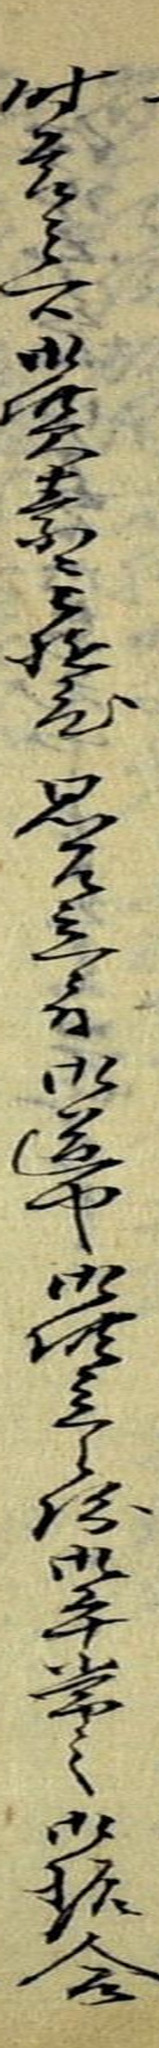時節に候へは御質素に被遊度思召立に付御道中御供立之儀御平常之振合
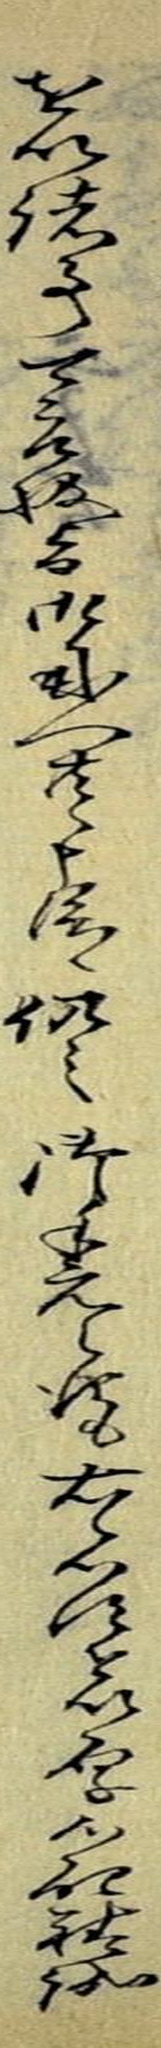を以諸事可取扱旨御用人共被申渡候仍之御手元之儀も右心得を以厚心配精誠
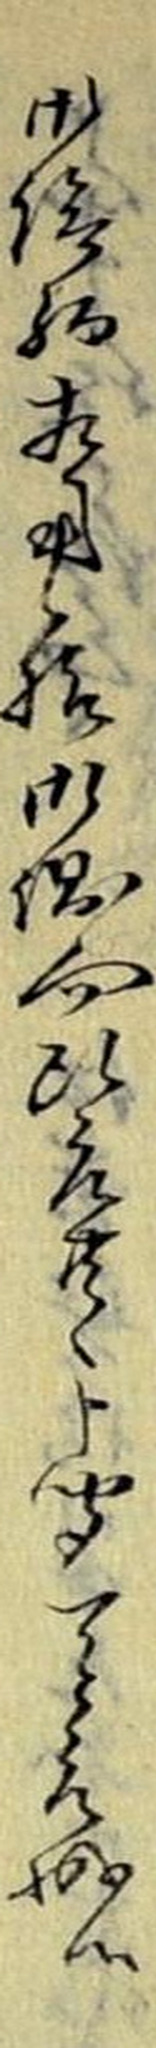御倹約相用候様御側向頭取共へ申聞可被取扱候
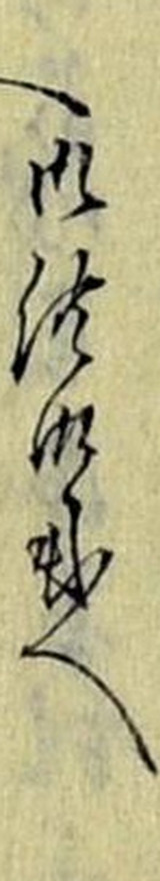御供御用人
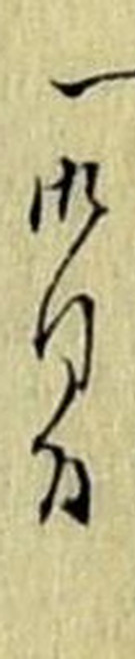御目付
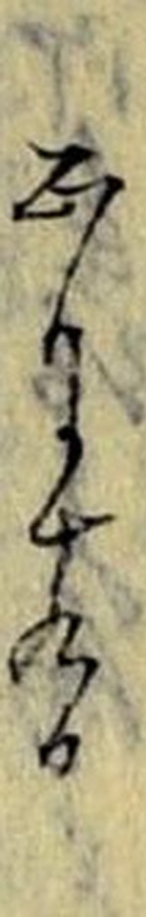正月十九日
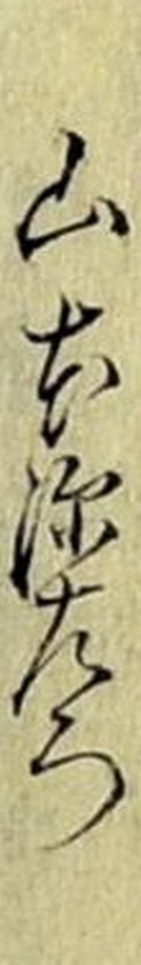山本源左衛門
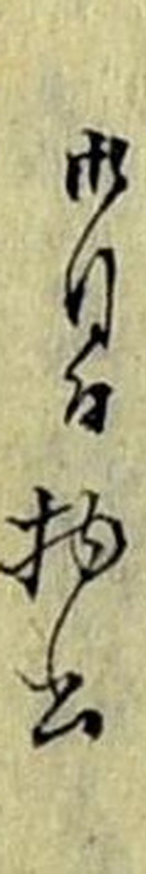御目付物書
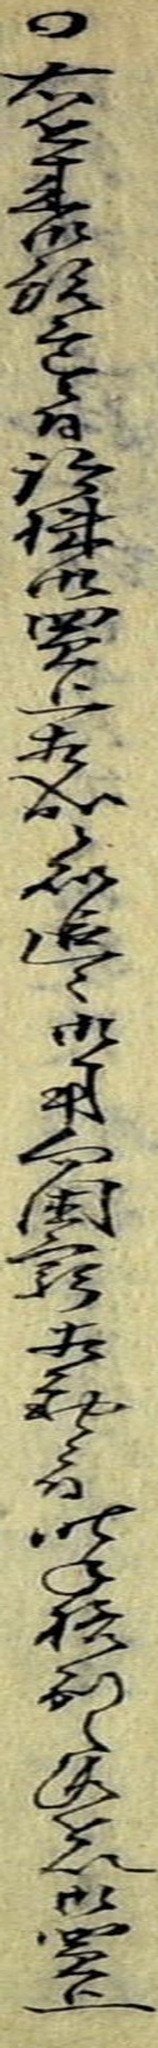○右近来御趣意に付跡株御買上相成候処追々御用向困窮相勤候に付昨年格別之趣を以御買上
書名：命令之部 六
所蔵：福井県文書館 Fukui Prefectural Archives
